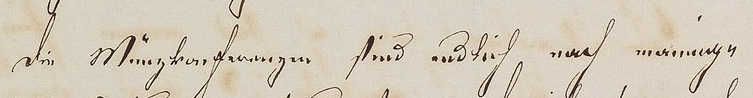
Die Münzkonferenzen sind endlich nach mannig-
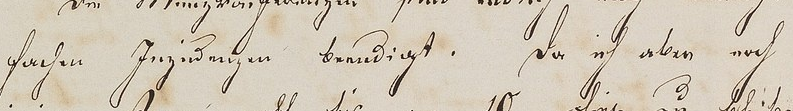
fachen Inzidenzen beendigt. Da ich aber noch
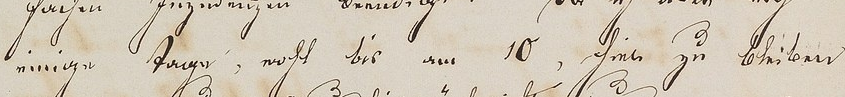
einige Tage, wohl bis am 10, hier zu bleiben
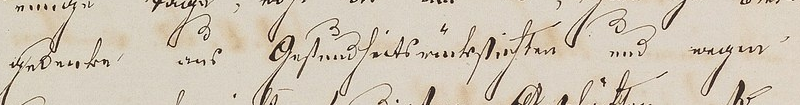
gedenke aus Gesundheitsrücksichten und wegen
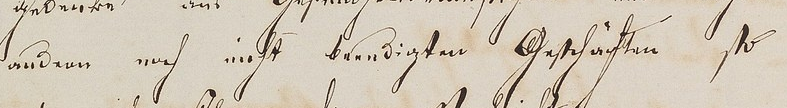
andern noch nicht beendigten Geschäften so
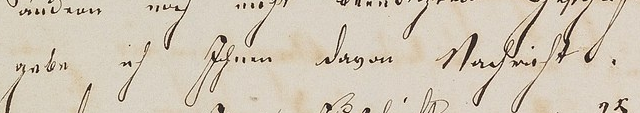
gebe ich Ihnen davon Nachricht.
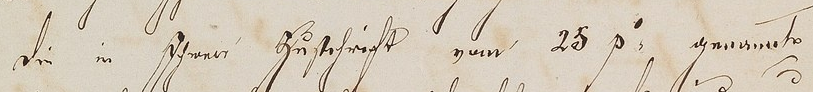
Die in Ihrer Zuschrift vom 25 po genannte
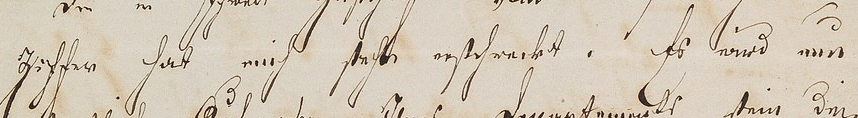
Ziffer hat mich sehr erschreckt. Es wird nun
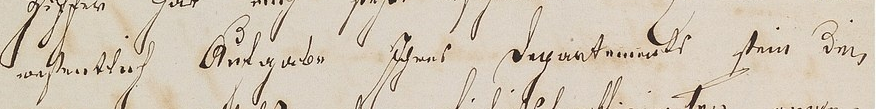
wesentlich Aufgabe Ihres Departements sein die-
